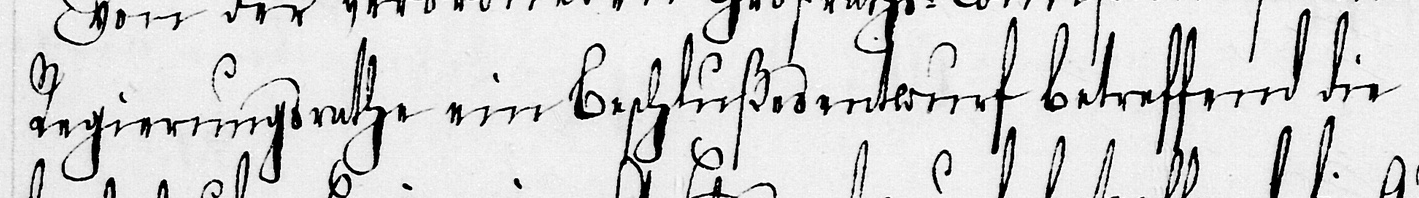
Regierungsrathe ein Beschlußesentwurf betreffend die
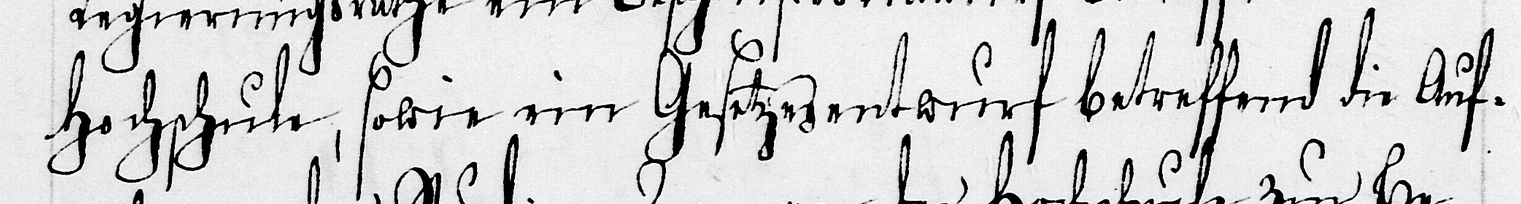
Hochschule, sowie ein Gesetzesentwurf betreffend die Auf¬
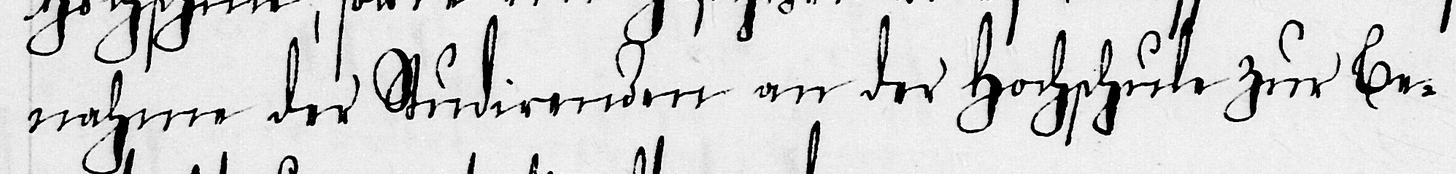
nahme der Studirenden an der Hochschule zu Be¬
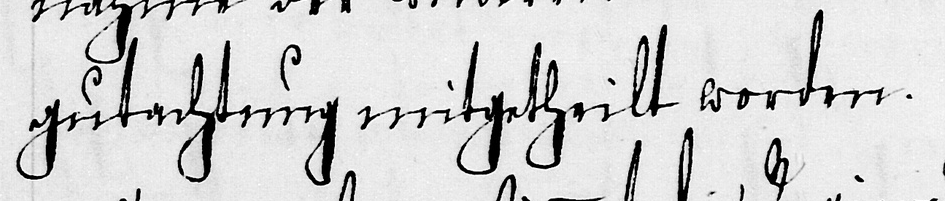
gutachtung mitgetheilt worden.
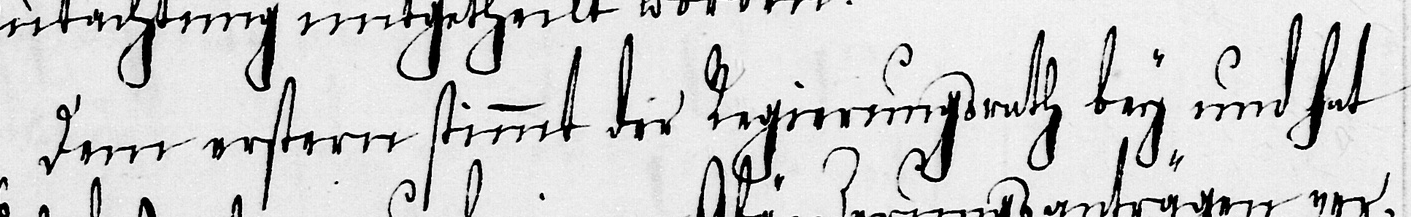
Dem erstern stimmt der Regierungsrath bey und hat
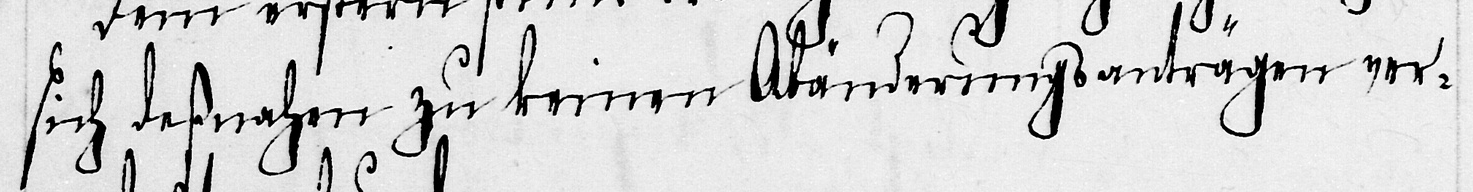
sich deßnahen zu keinen Abänderungsanträgen ver¬
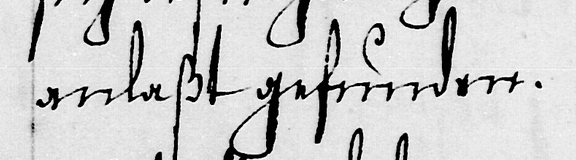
anlaßt gefunden.
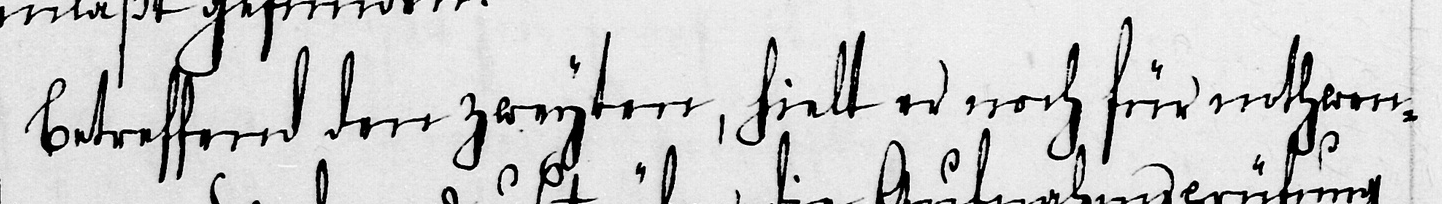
Betreffend den zweyten, hielt er noch für nothwen¬
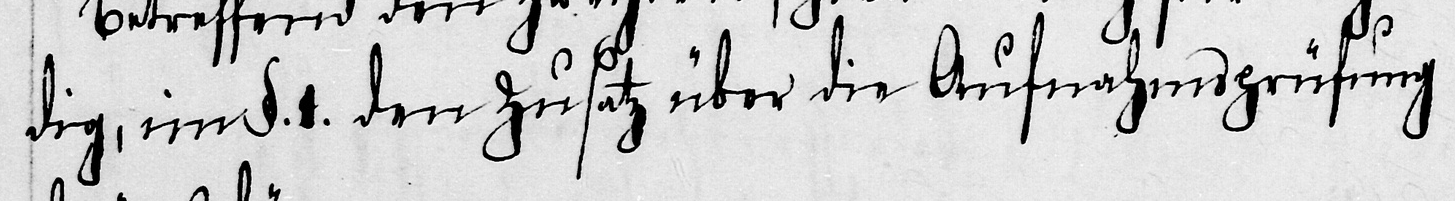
dig, in §. 1. den Zusatz über die Aufnahmsprüfung
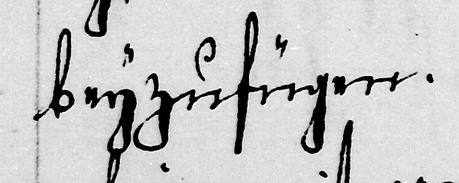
beyzufügen.
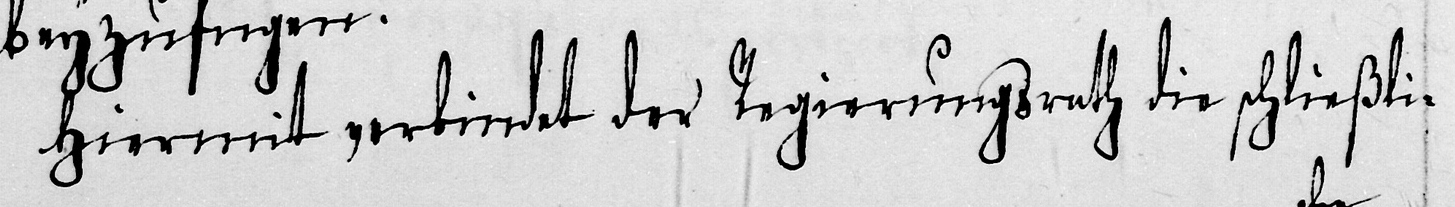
Hiermit verbindet der Regierungsrath die schließli-
